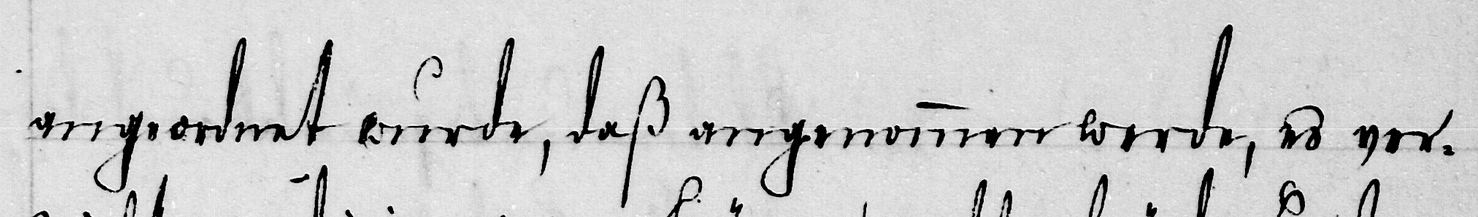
angeordnet wurde, daß angenommen werde, es ver¬
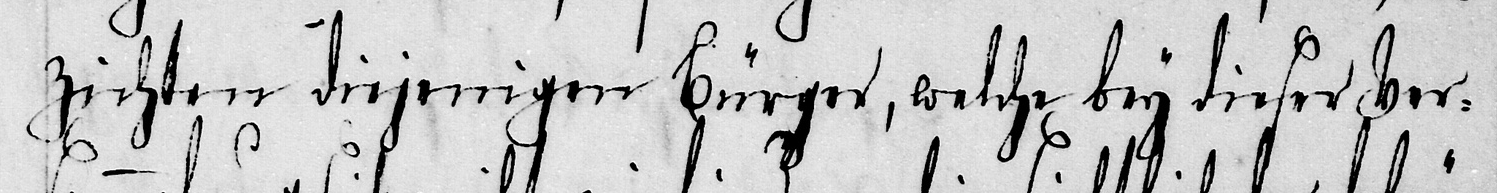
zichten diejenigen Bürger, welche bey dieser Ver¬
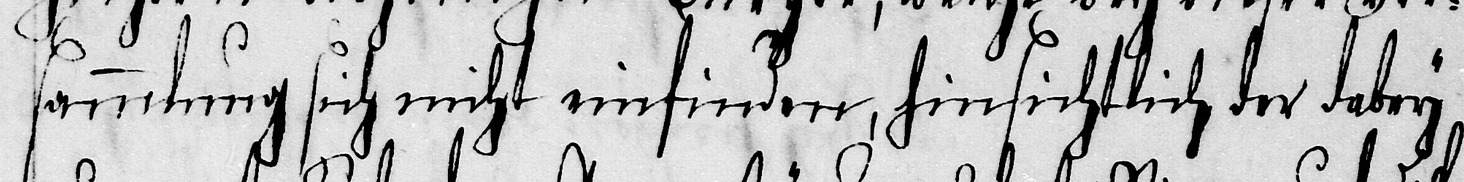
sammlung sich nicht einfinden, hinsichtlich der dabey
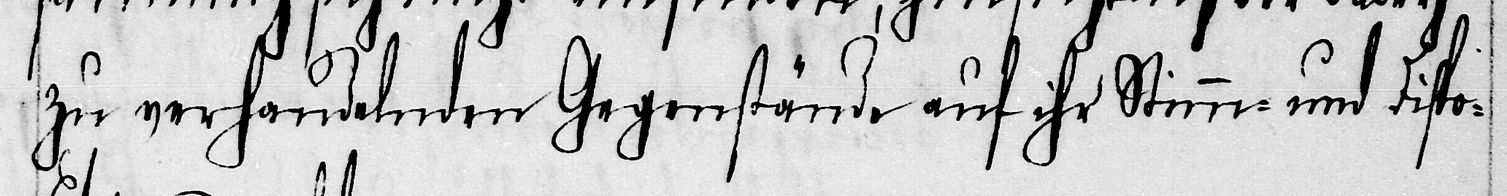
zu verhandelnden Gegenstände auf ihr Stimm- und Dis¬
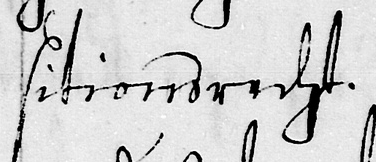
sitionsrecht.
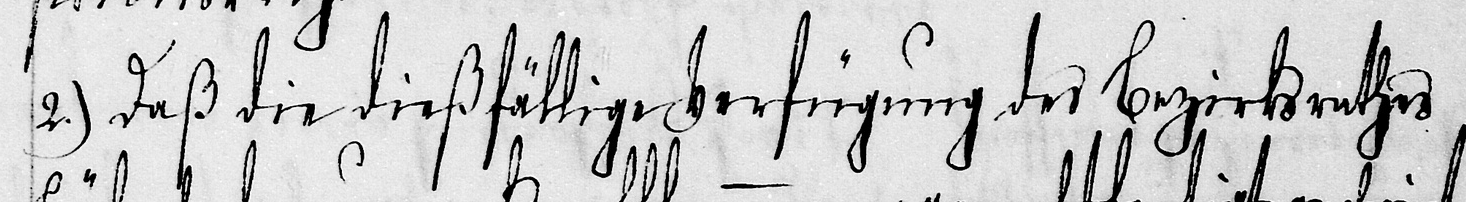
2.) Daß die dießfällige Verfügung des Bezirksrathes
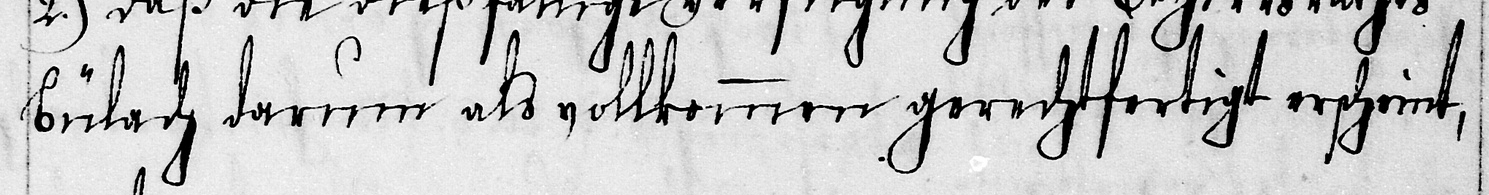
Bülach darum als vollkommen gerechtfertigt ersche¬
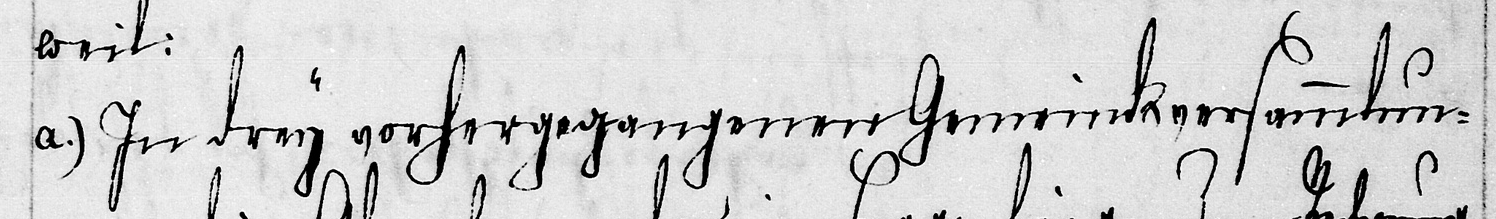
a.) In drey vorhergegangenen Gemeindsversammlun¬
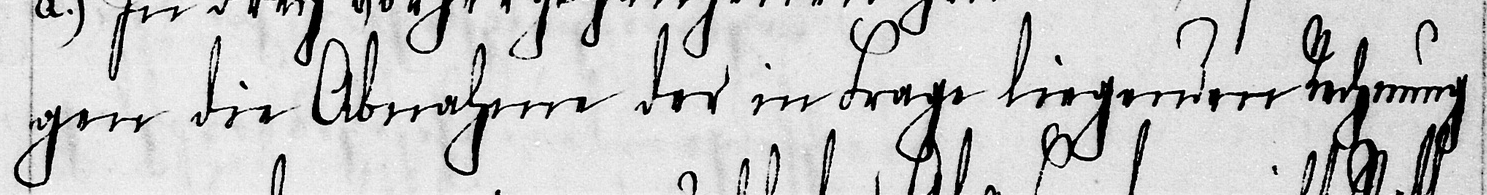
gen die Abnahme der in Frage liegenden Rechnung
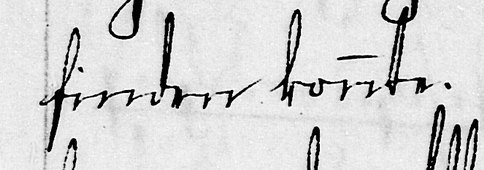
finden konnte.
